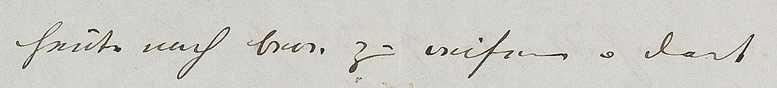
heute nach Bern zu reisen & dort
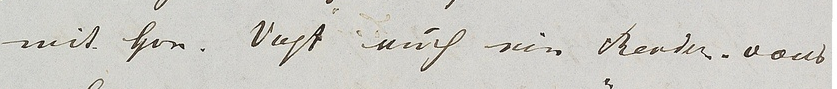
mit Hrn. Vogt auch ein Rendez-vous
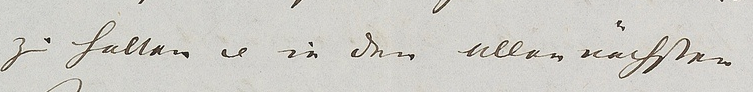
zu halten & in den allernächsten
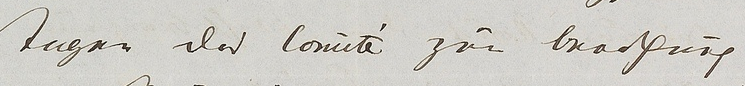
Tagen das Comité zur Berathung
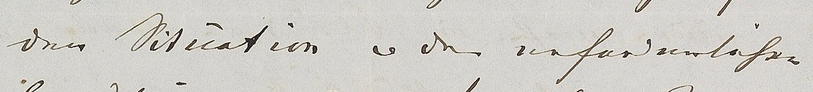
der Situation & den erforderlichen
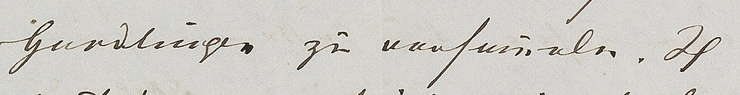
Handlungen zu versammeln. Ich
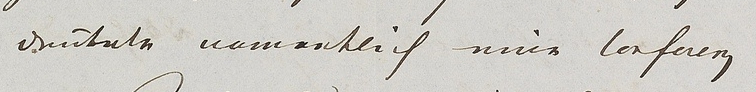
deutete namentlich eine Conferenz
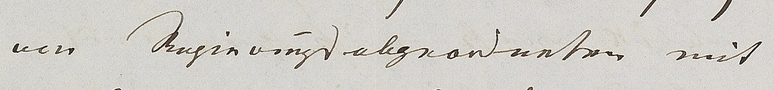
von Regierungsabgeordneten mit
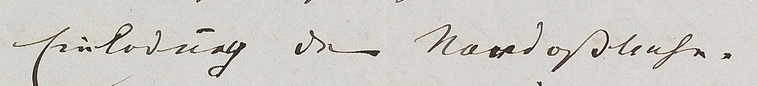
Einladung der Nordostbahn--
